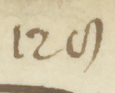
128
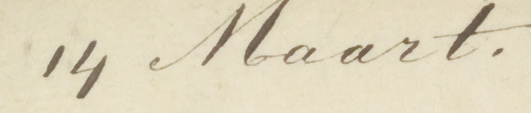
14 Maart
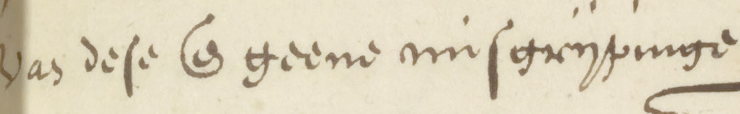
Van dese & geene misgrijpinge
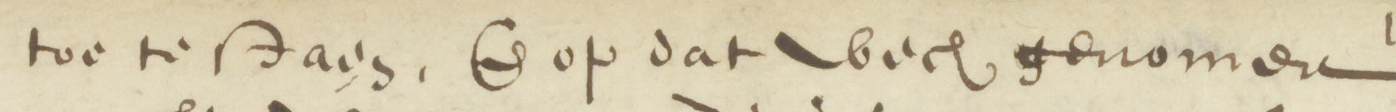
toe te staen & op dat wech genomen
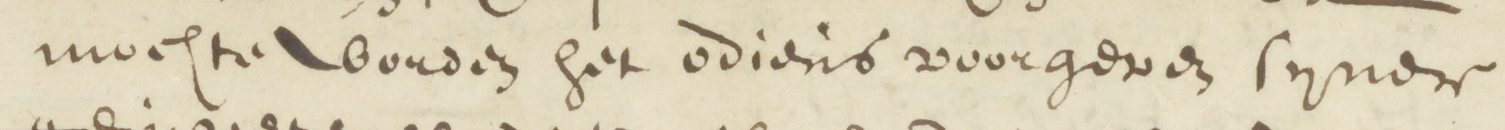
mochte worden het odieus voorgeven sijner
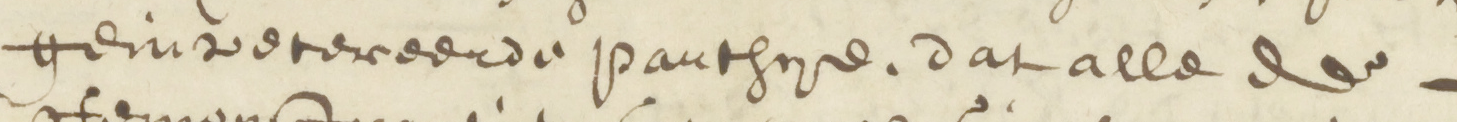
geinvetereerde parthije, dat alle de
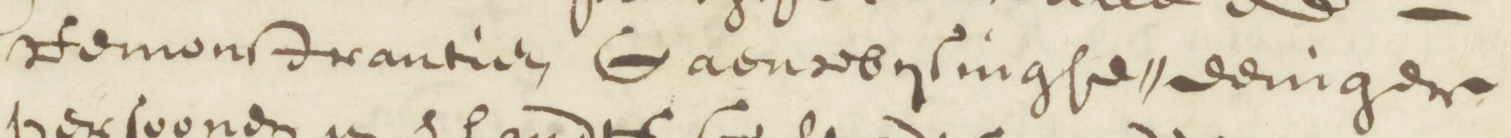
Remonstrantien & aenwijsinghe,, eeniger
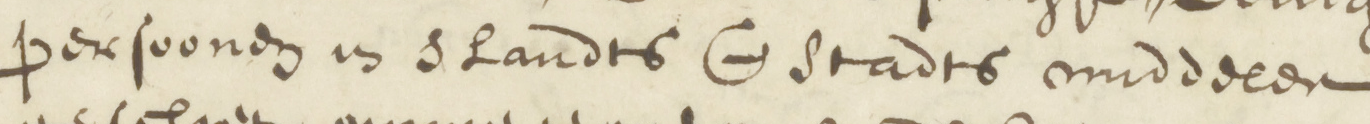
persoonen in s landts & stadts middelen
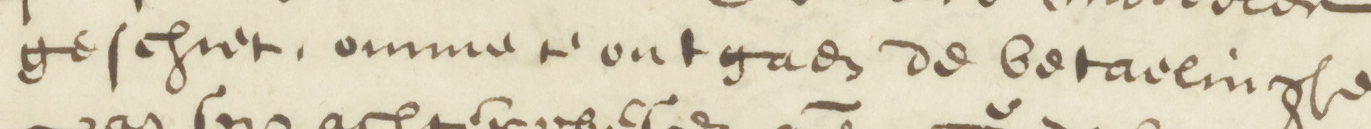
geschiet, omme t' ontgaen de betaelinghe
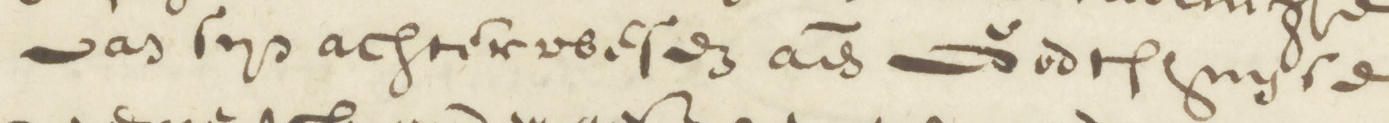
van sijn achterwesen aen Godtshuyse,
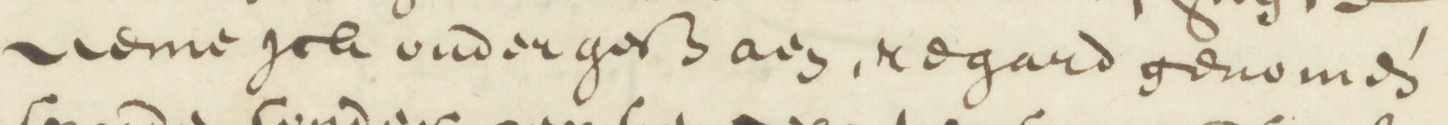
neme Ick ondergescr. aen, regard genomen
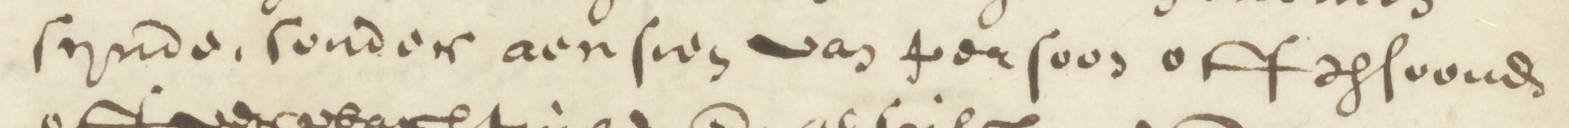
sijnde, sonder aensien van persoon off persoonen
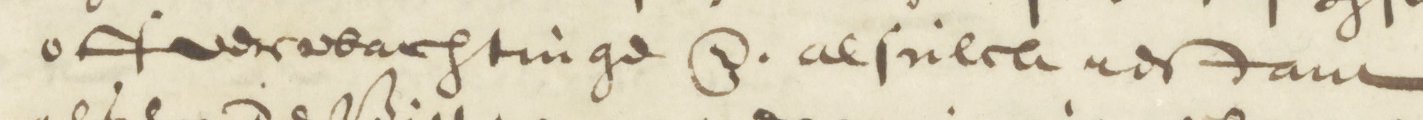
oft verwachtinge & alsulck restant
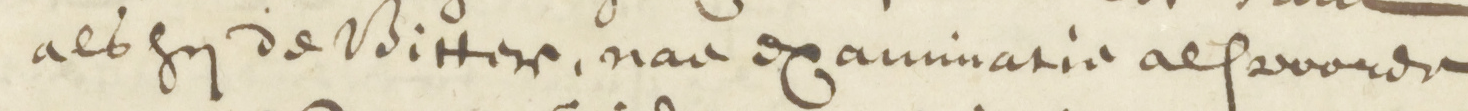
als hij de Bitter, nae examinatie alsvooren
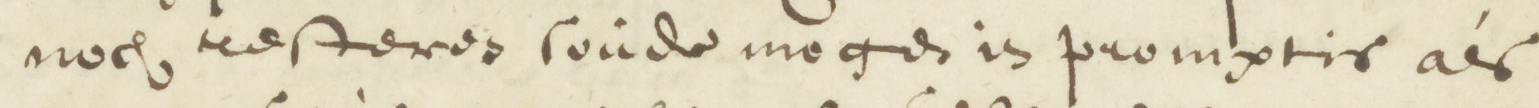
noch resteren soude mogen in promptis als
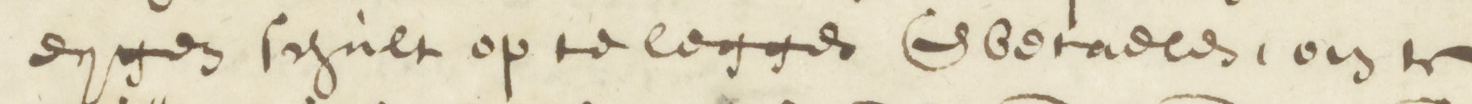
eygen schult op te leggen & betaelen om te
